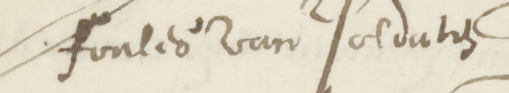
foules van soldaten
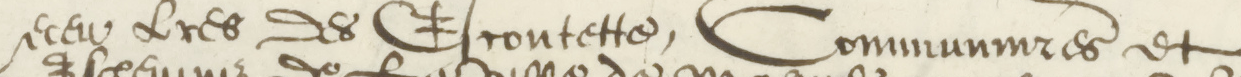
Receu lres des Escoutette, Communmres et
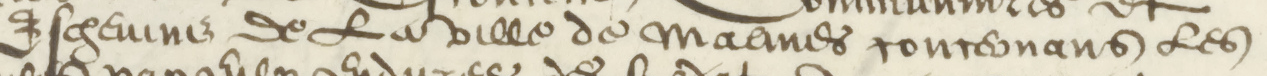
Escheuins de la ville de malines concernans les
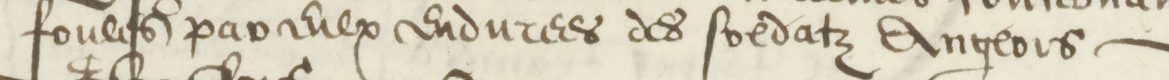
foules par eulx endurees des soldatz Anglois et
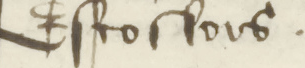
Escossois.
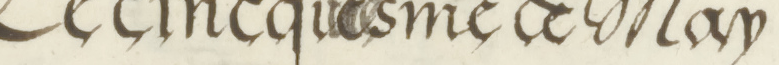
Le cincquisme de May
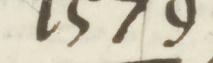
1579.
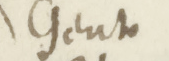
Gent
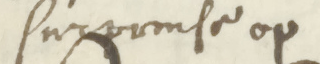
surprinse op
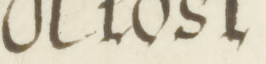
Alost
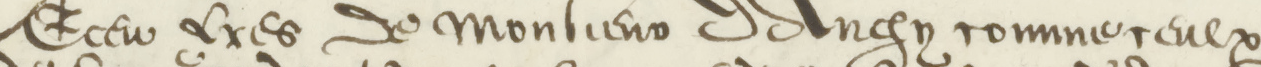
Receu lres de monsieur D‛Anchy comme ceulx
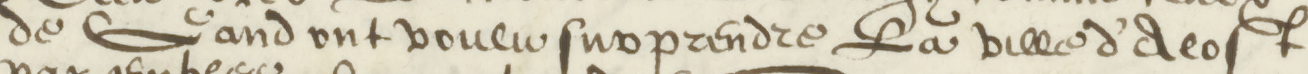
de Gand ont voulu surprendre la ville d'Alost
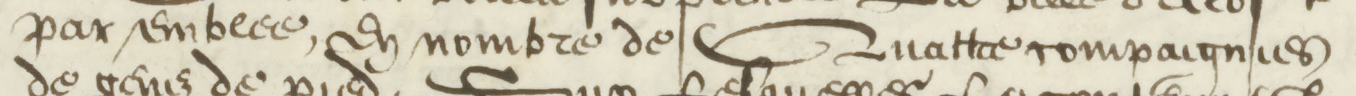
par emblee, en nombre de Quattre compaignies
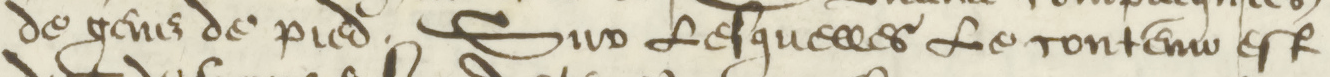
de genie de pied. Sur lesquelles le contenu est
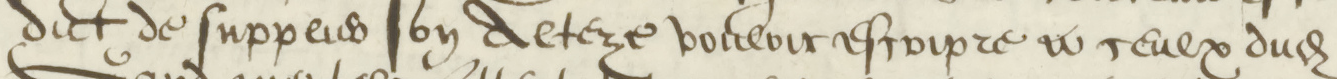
dict de supplier Son Alteze vouloir escripre a ceulx dud
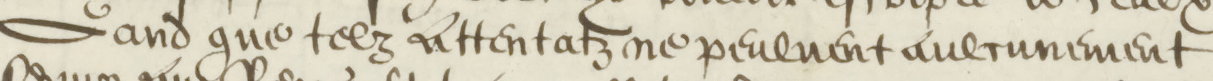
Gand que telz attentatz ne peuluent aulcunement
